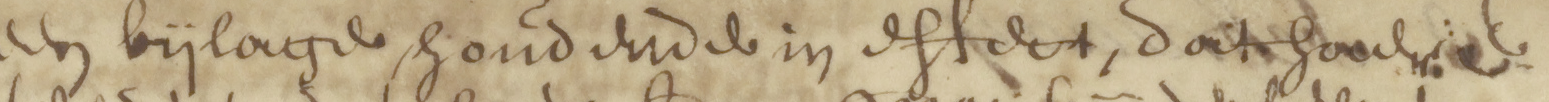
een bijlage, houdende in effect, dat haer E.
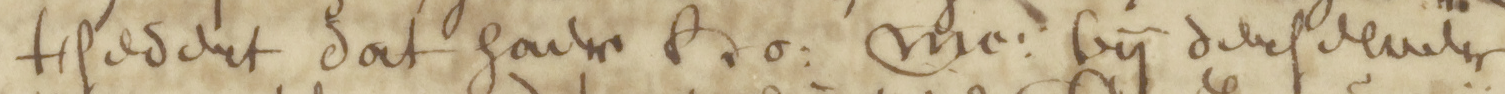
t‛sedert dat haer Ho:Mo: bij derselver
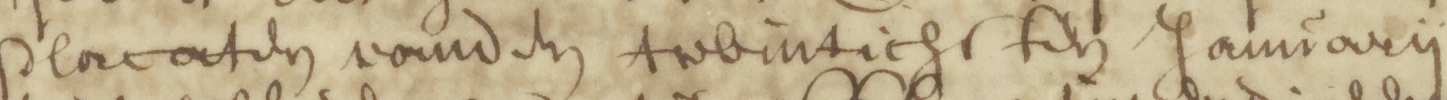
Placaten vanden twintichsten Januarij
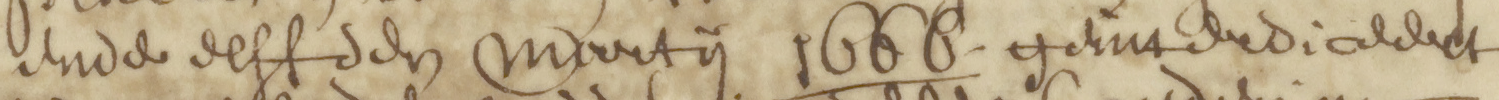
ende elffden Martij 1666. geinterdiceert
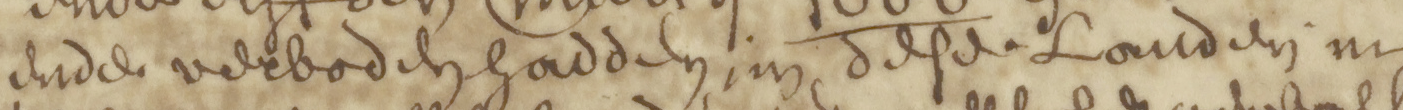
ende verboden hadden, in dese Landen in
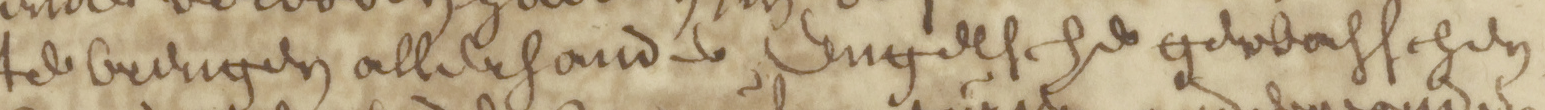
te brengen allerhande Engelsche gewasschen,
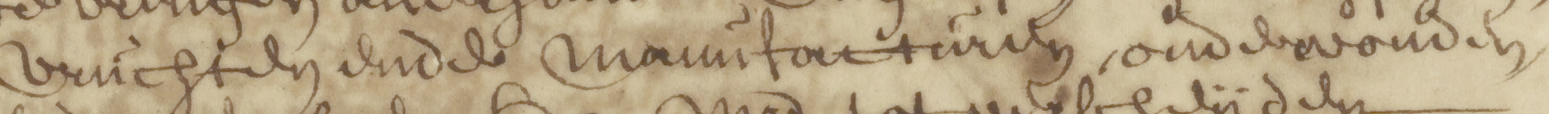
vruchten ende manufacturen, ondervonden,
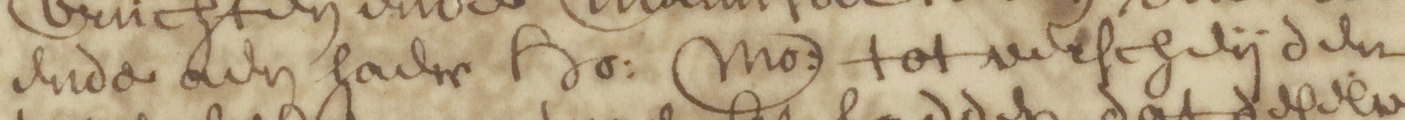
ende aen haer Ho:Mo: tot verscheijden
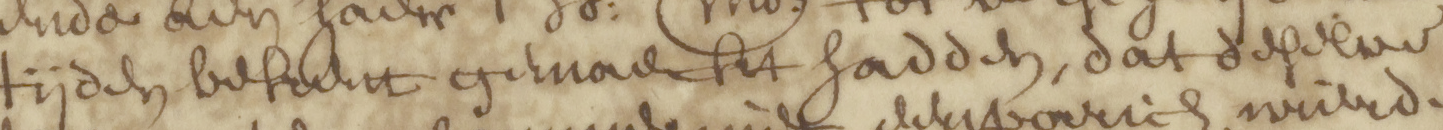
tijden bekent gemaeckt hadden, dat deselve
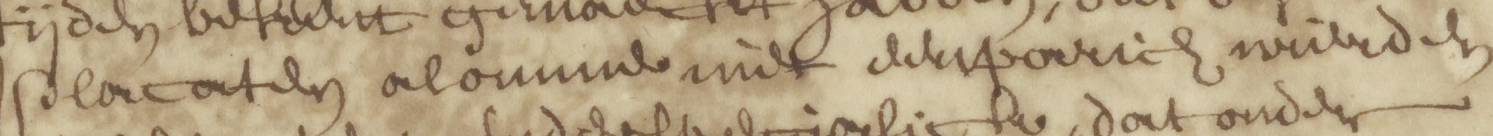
Placaten alomme niet eenparich wierden
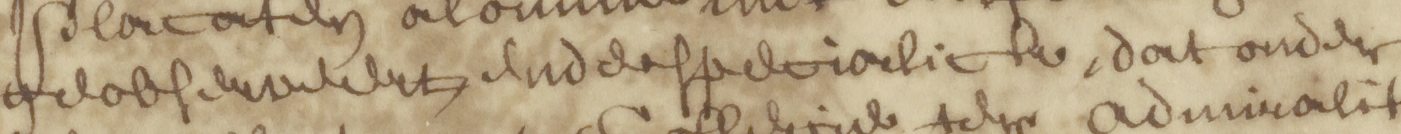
geobserveert, ende specialick, dat onder
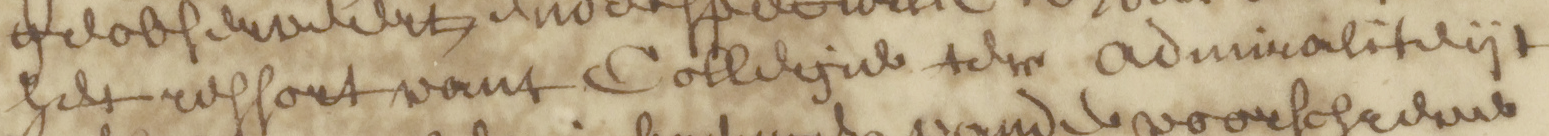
het ressort vant Collegie ter Admiraliteijt
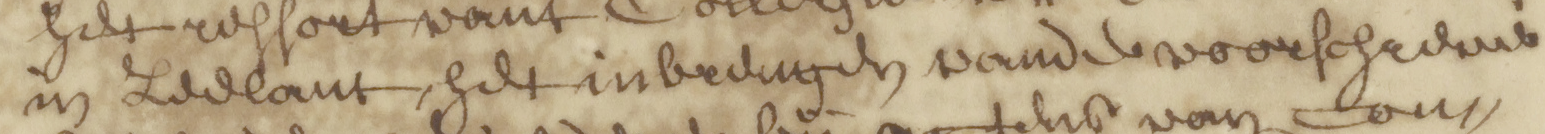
in Zeelant, het inbrengen vande voorschreve
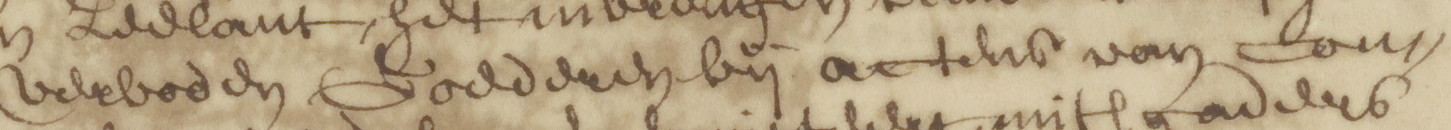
verboden Goederen bij actens van con„
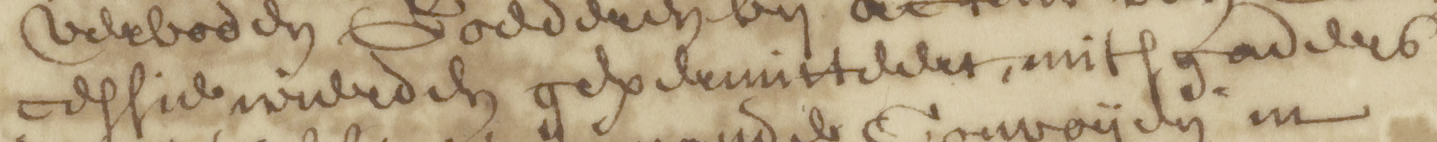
cessie wierden gepermitteert, mitsgaders
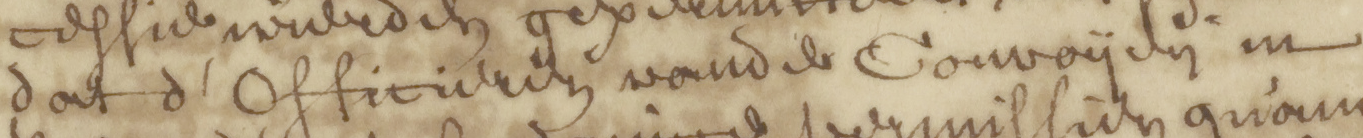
dat d'Officieren vande Convoijen in
